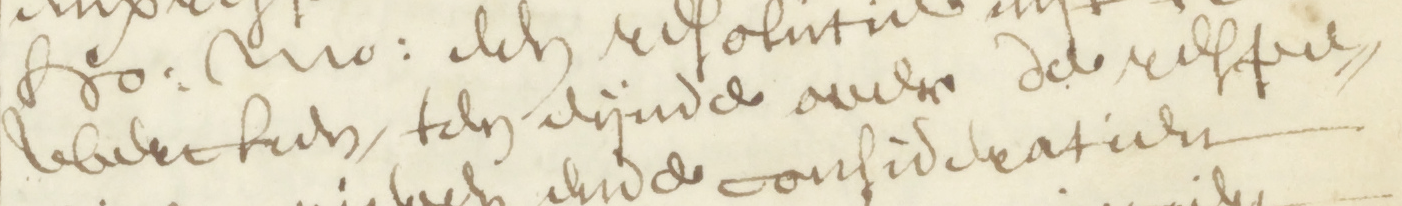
wercken, ten eijnde over de respe„
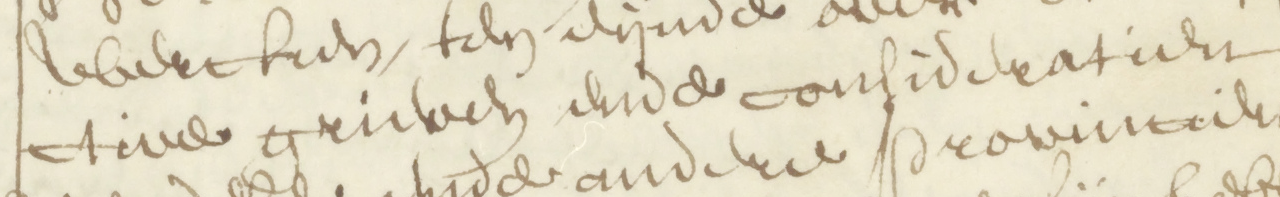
ctive grieven ende consideratien
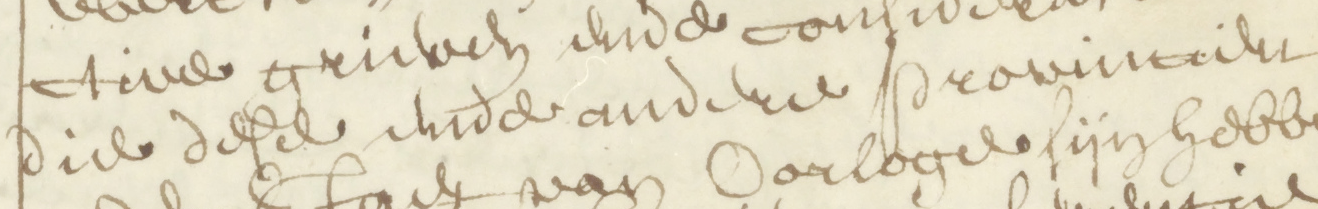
die dese ende andere provincien
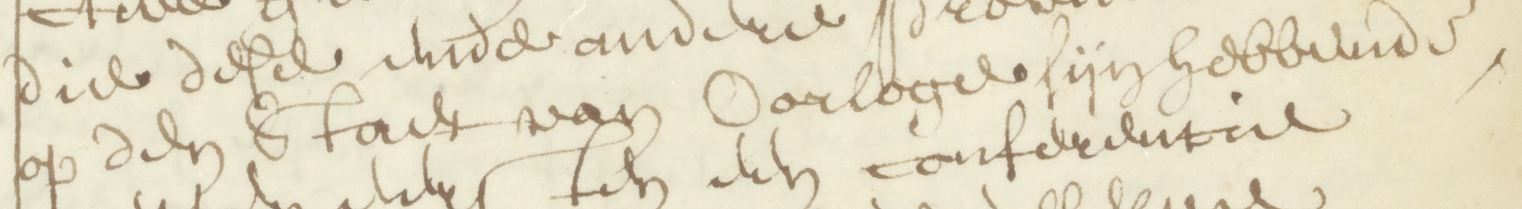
op den Staet van Oorloge sijn hebbende,
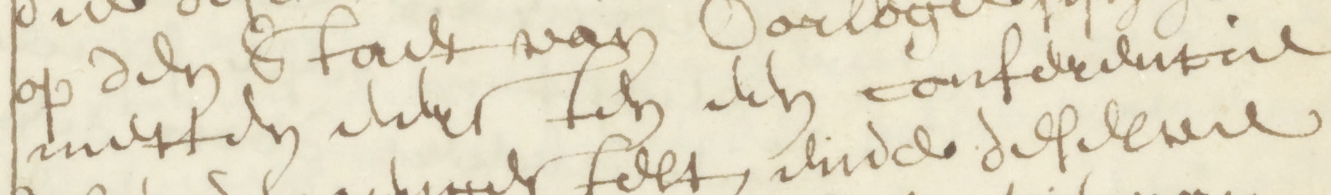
metten eersten een conferentie
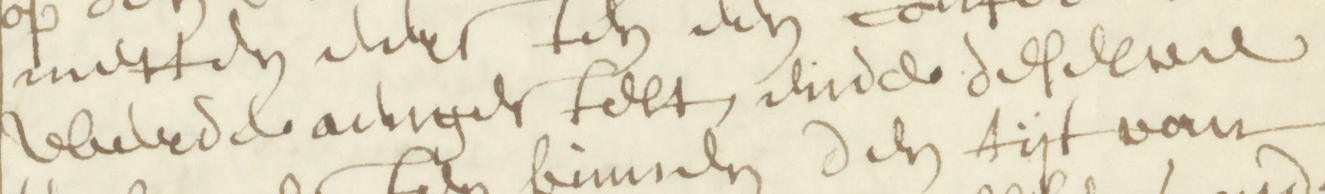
werden aengestelt, ende deselve
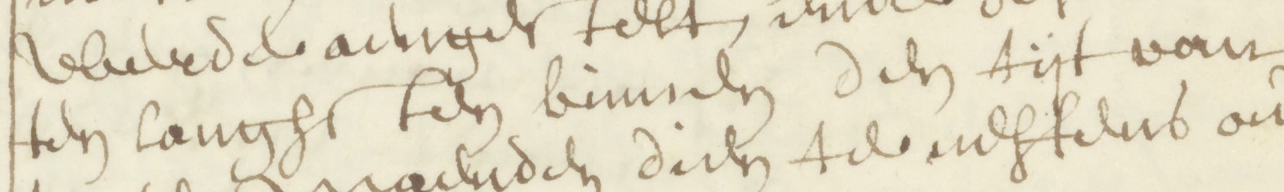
ten langhsten binnen den tijt van
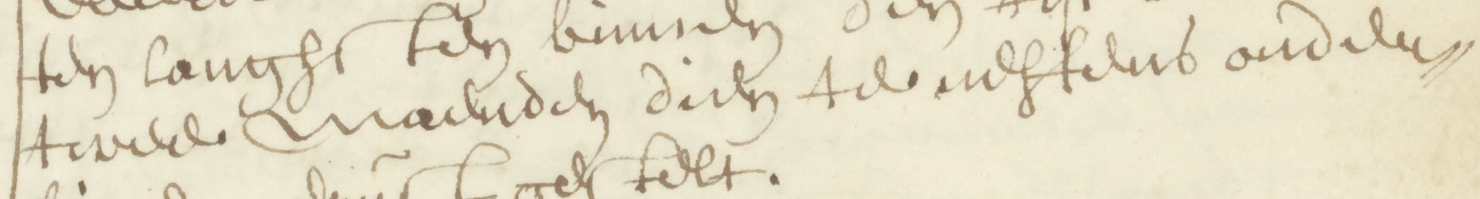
twee Maenden dien te neffens onder„
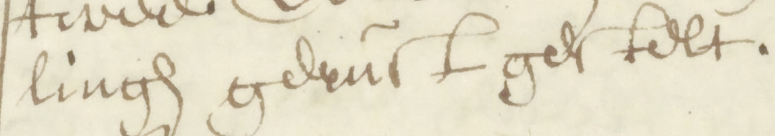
lingh gerust gestelt.
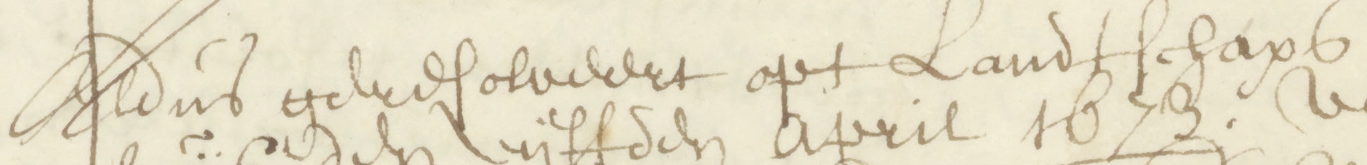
Aldus geresolveert opt Landtschaps
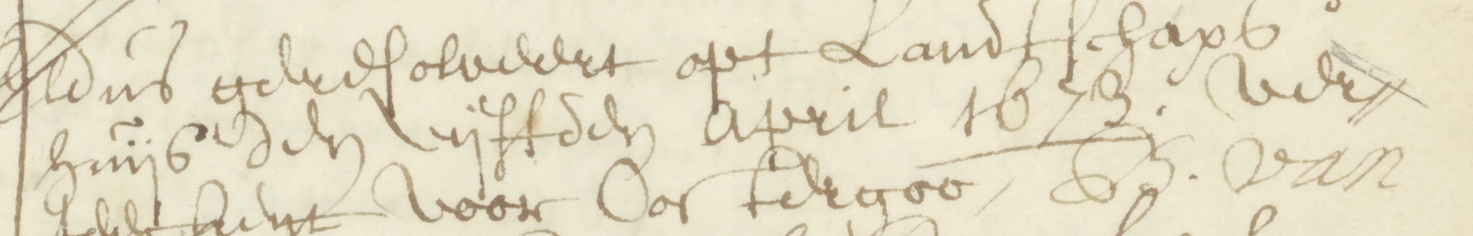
huijs den vijffden April 1673. ver„
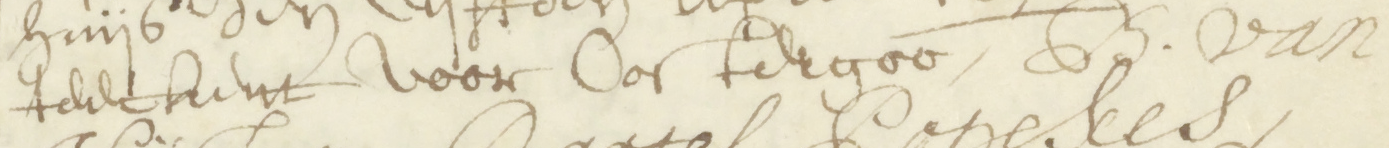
teeckent voor Oostergoo, B. van
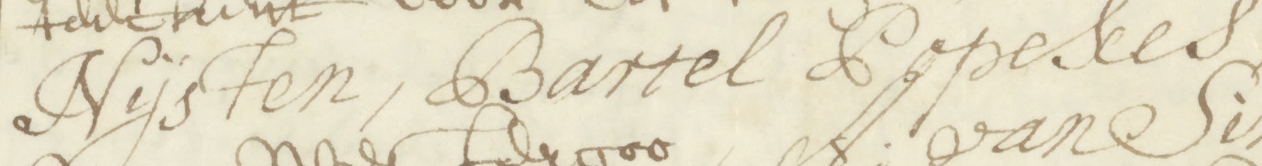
Nijsten, Bartel Popekes,
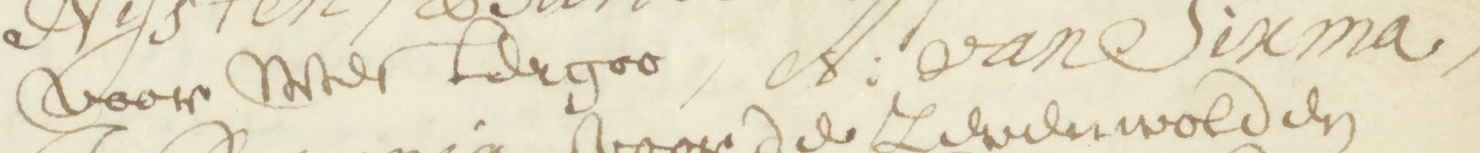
voor Westergoo A: van Sixma,
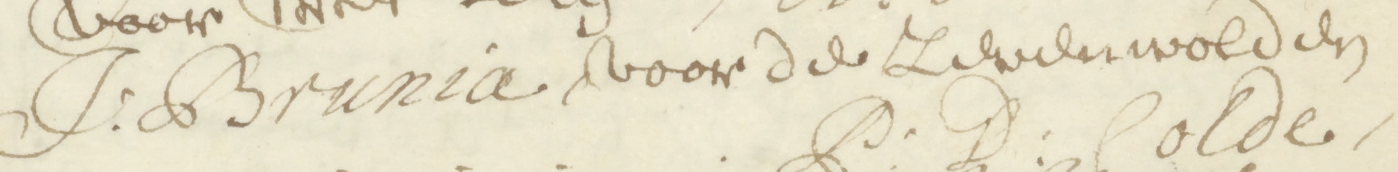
J: Brunia, voor de Zevenwolden
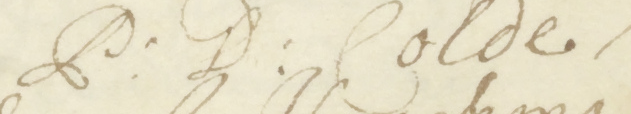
P:D: Colde,
